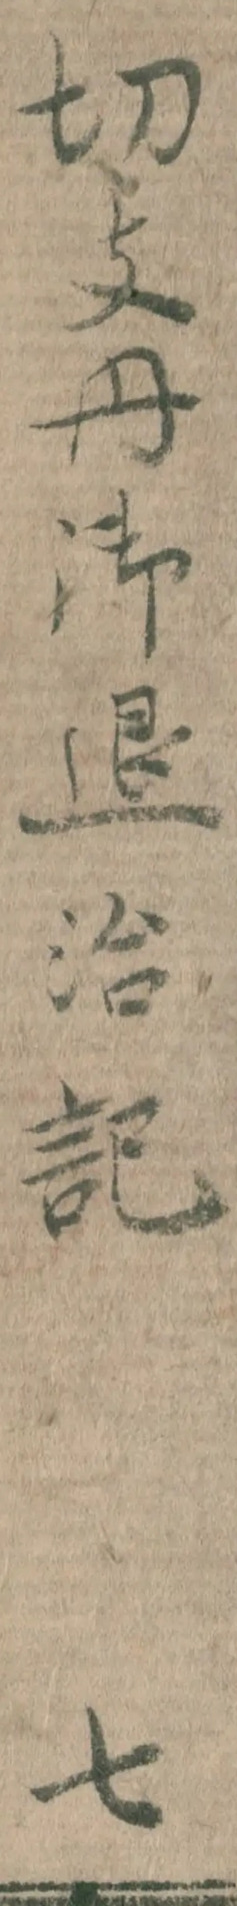切支丹御退治記七

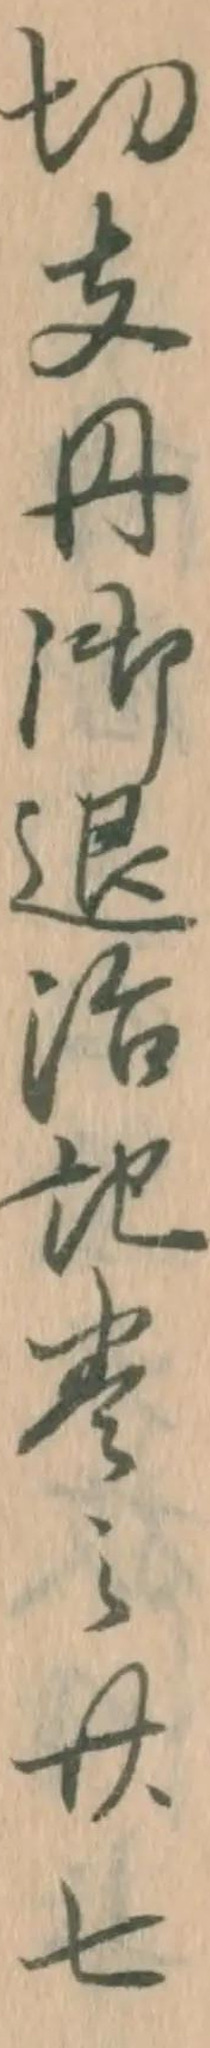切支丹御退治記巻之廿七
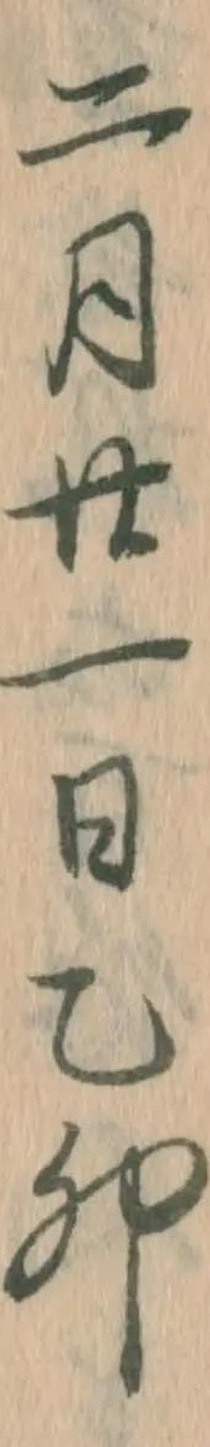二月廿一日乙夘
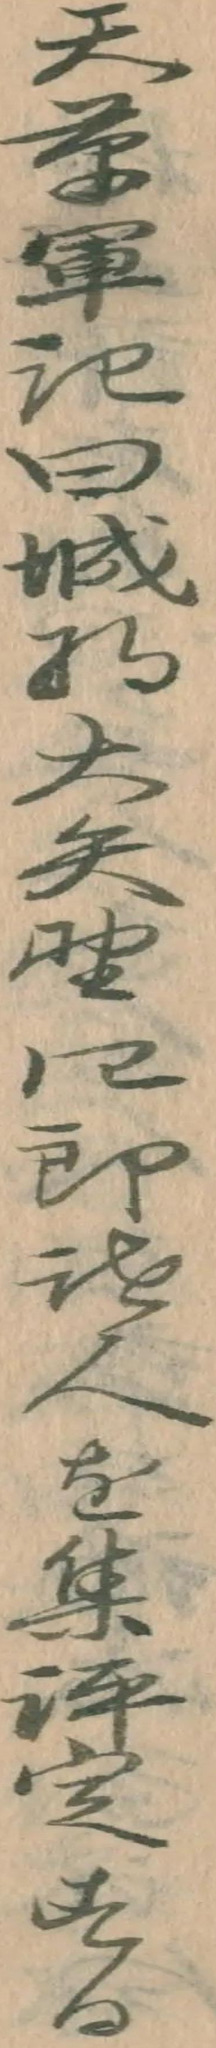天草軍記曰城将大矢野四郎諸人を集評定春る
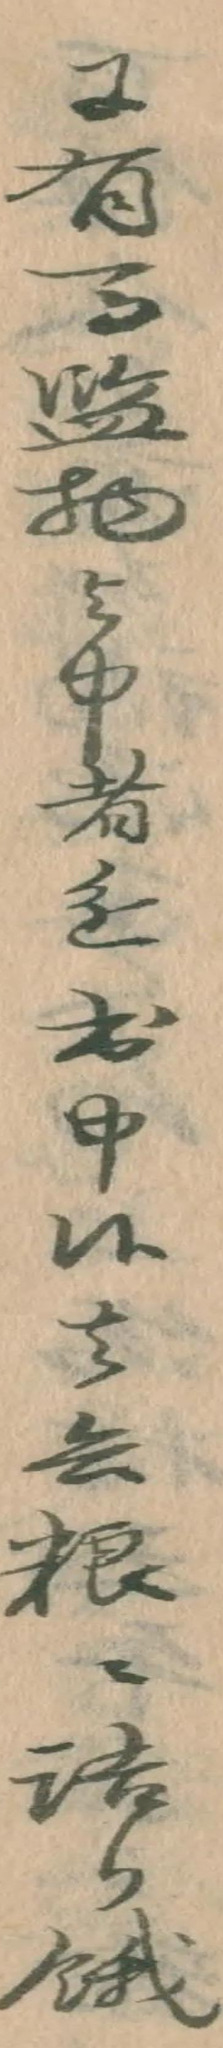尓有馬監物与申者懸出申候者兵粮に詰り餓
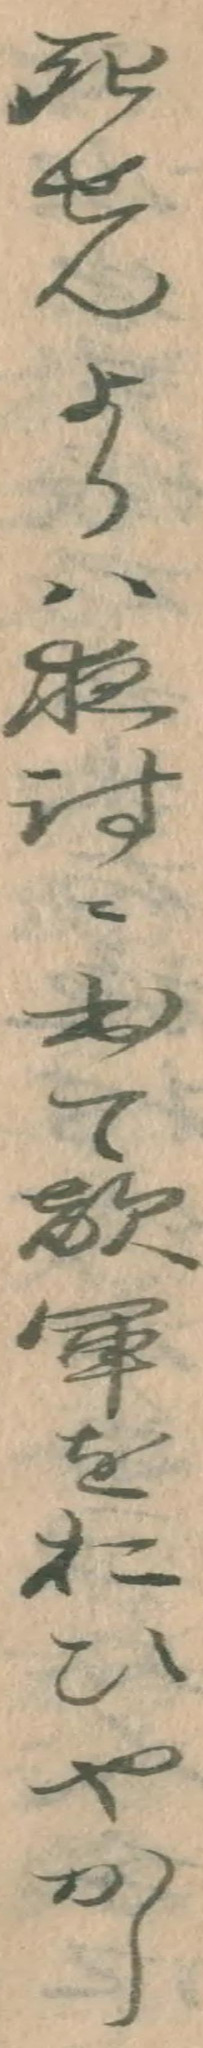死せんよりは夜討に出て敵軍を於ひやかし
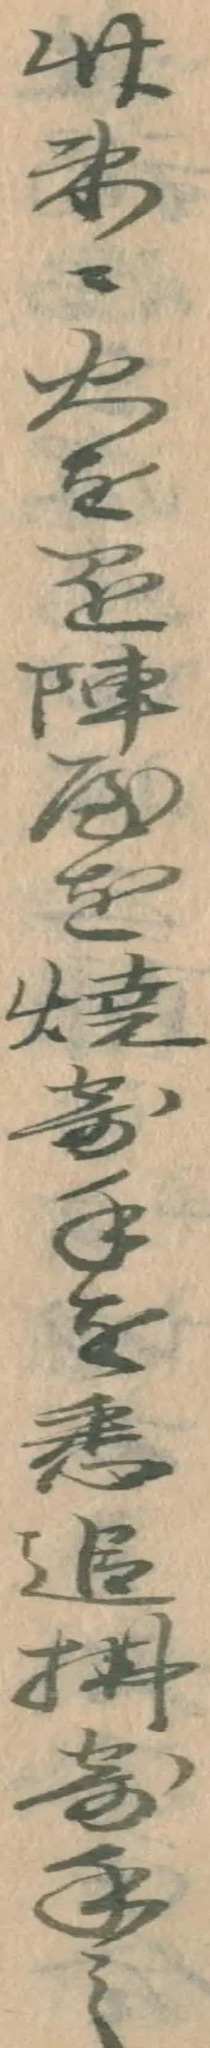竹束に火を懸陣屋を焼寄手を悉追払寄手之
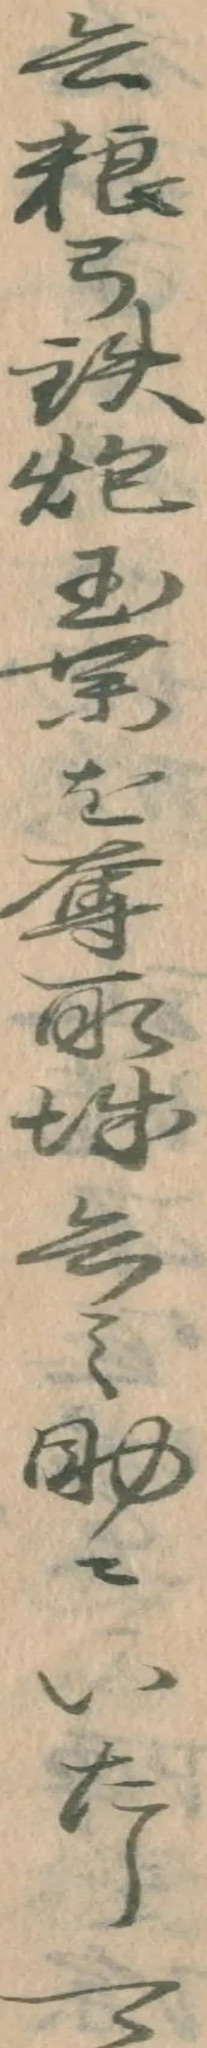兵粮弓鉄炮玉薬を奪取城兵之助にいたし可
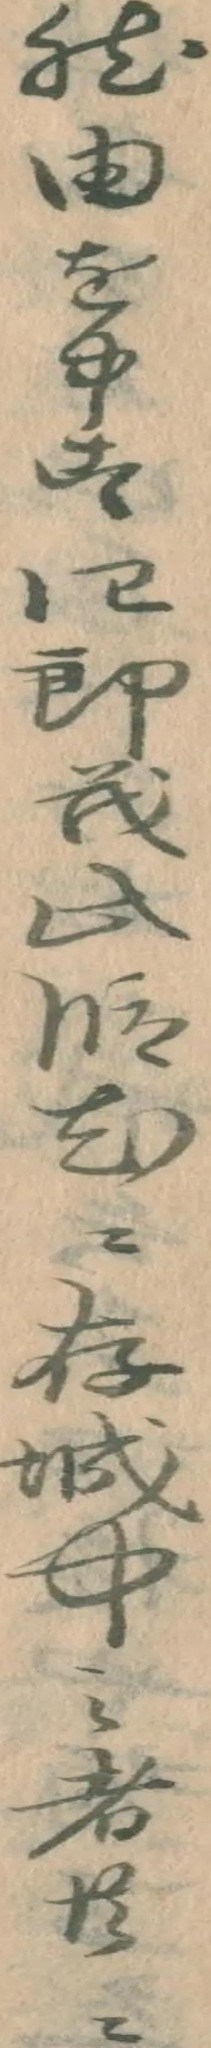然由を申春四郎茂此段尤に存城中之者共に
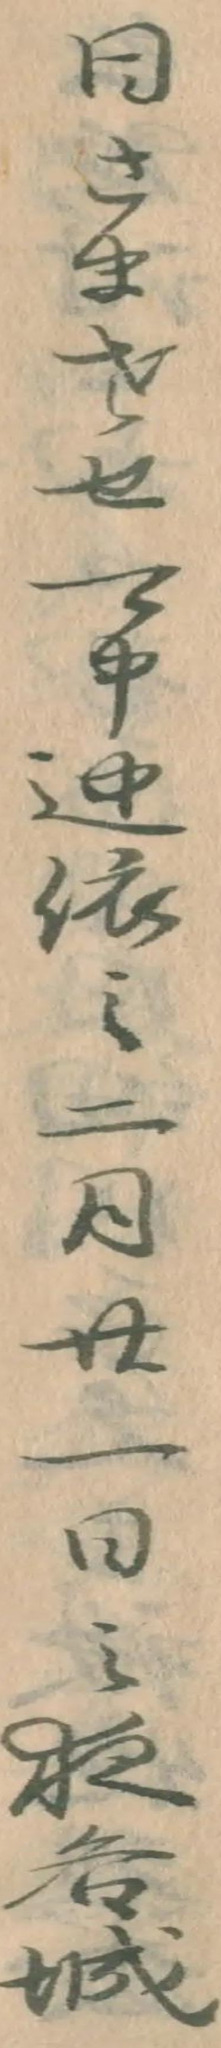目さまさせ可申迚依之二月廿一日之夜各城

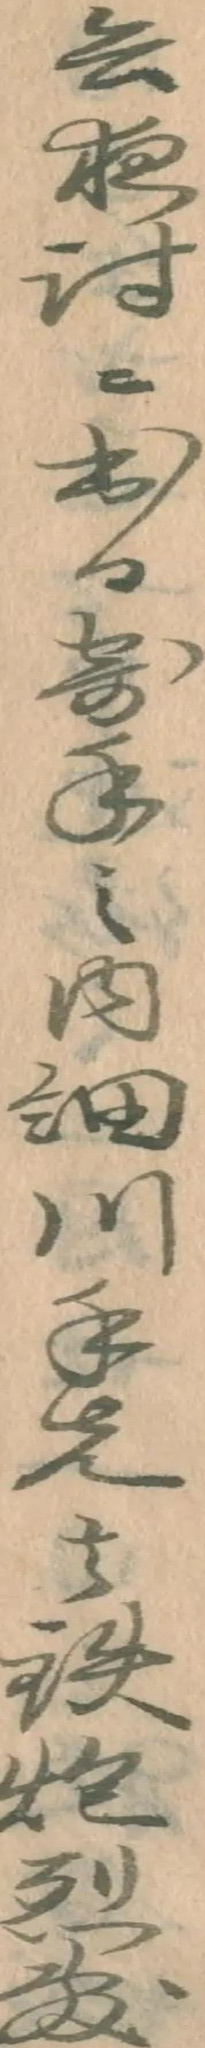兵夜討に出る寄手之内細川手先者鉄炮烈敷
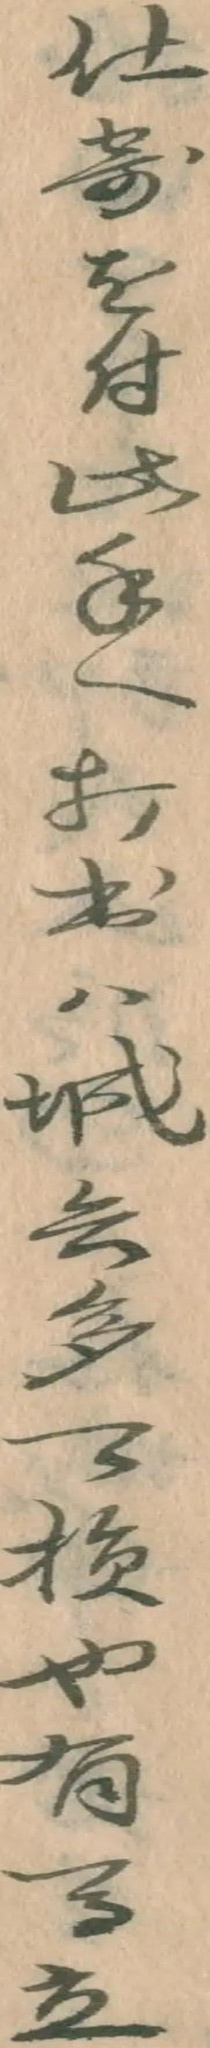仕寄を付此手へ打出は城兵多可損や有馬立
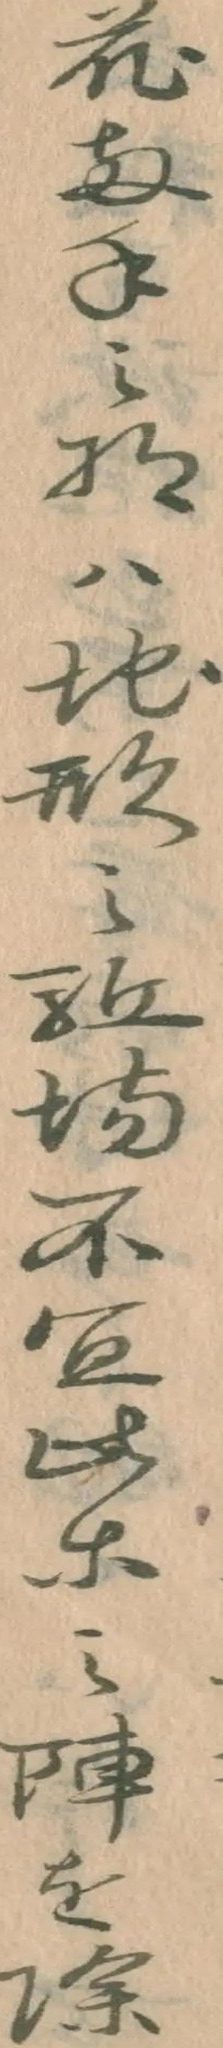花両手之将は地形之駈場不宜此等之陣を除
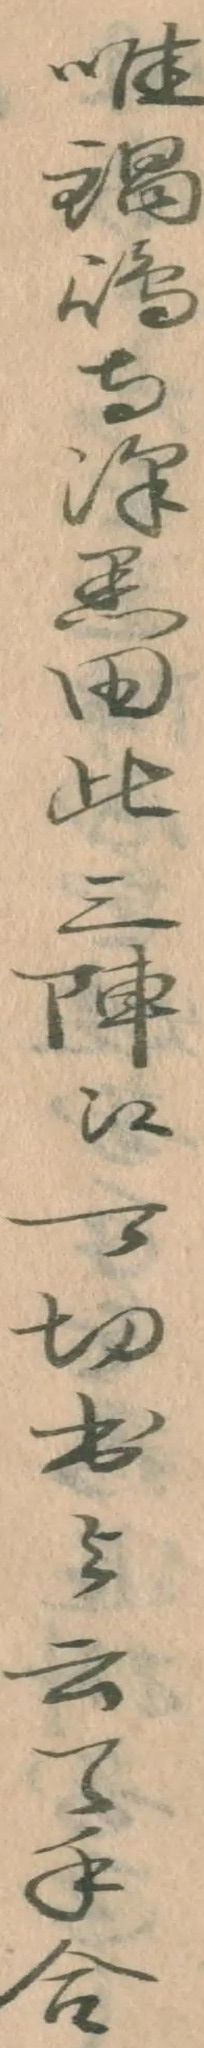唯鍋島寺沢黒田此三陣江可切出与云て手合
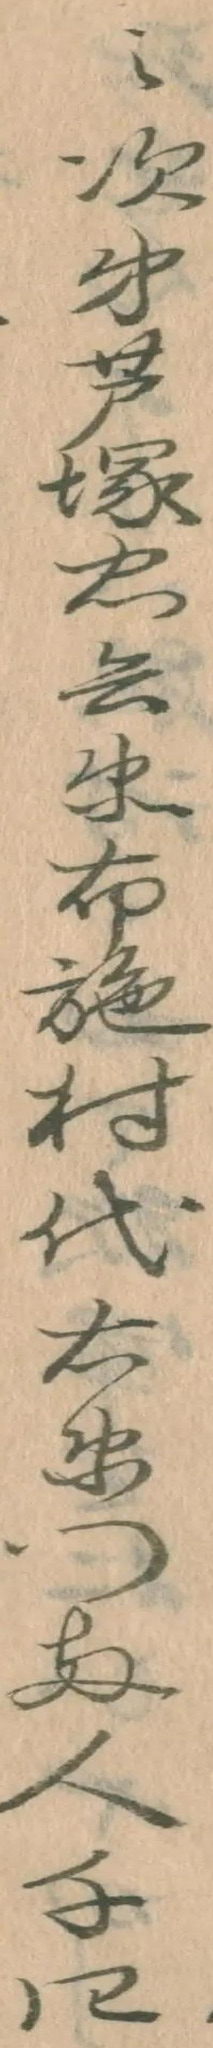之次第芦塚忠兵衛布施村代右衛門両人千四
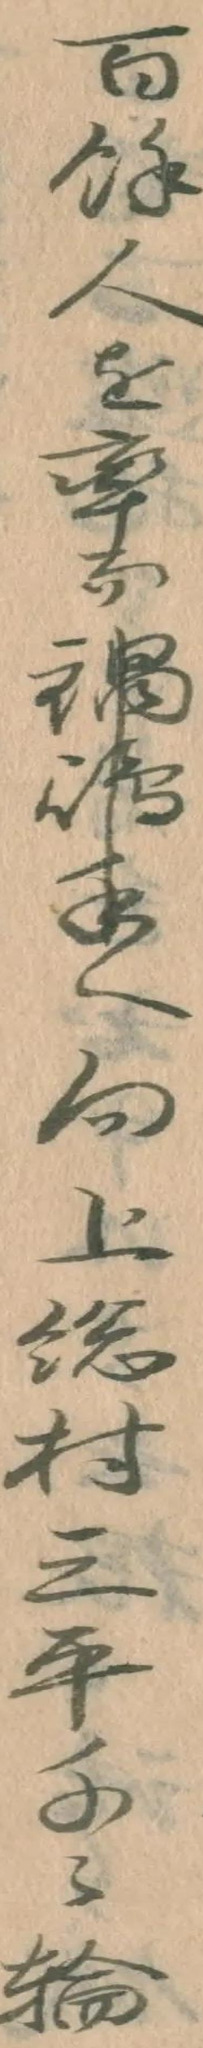百余人を率而鍋島手へ向上総村三平千々輪
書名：切支丹御退治記 49巻. [7]
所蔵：国立国会図書館 National Diet Library, JAPAN
